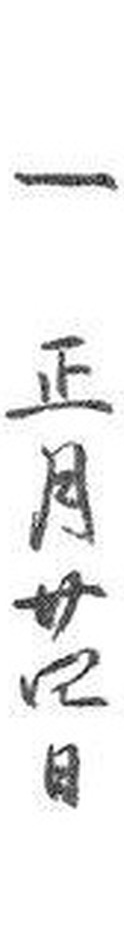一正月廿四日
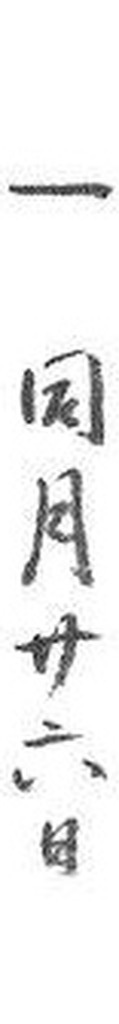一同月廿六日
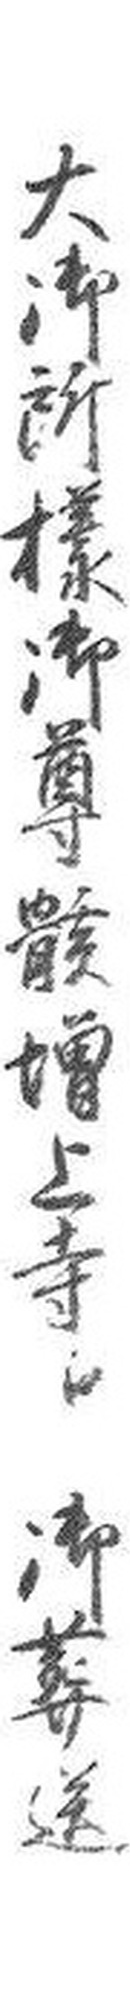大御所様御尊骸増上寺江御葬送
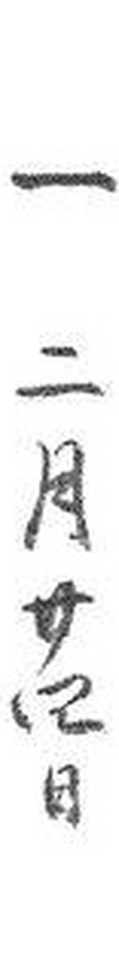一二月廿四日
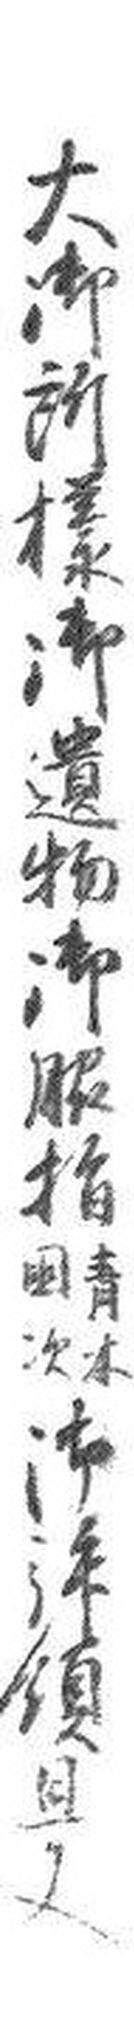大御所様御遺物御脇指青木国次御拝領且又
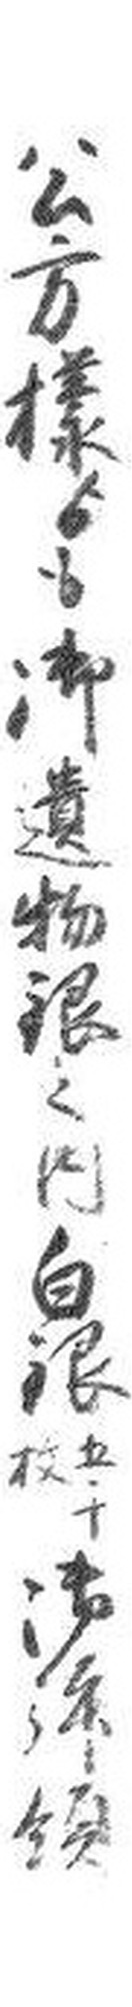公方様ゟも御遺物銀之内白銀五十枚御拝領
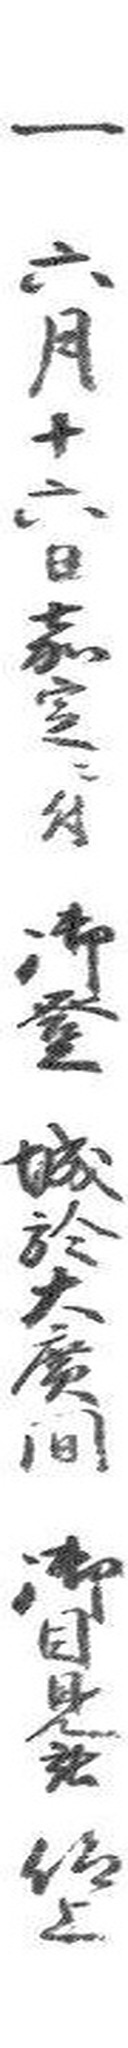一六月十六日嘉定ニ付御登城於大広間御目見被仰上
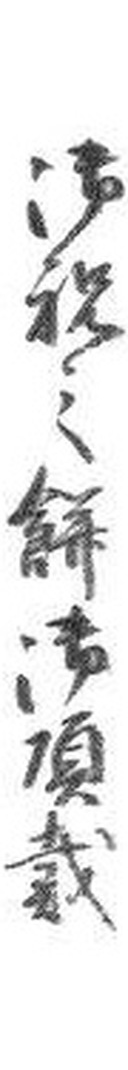御祝之餅御頂戴
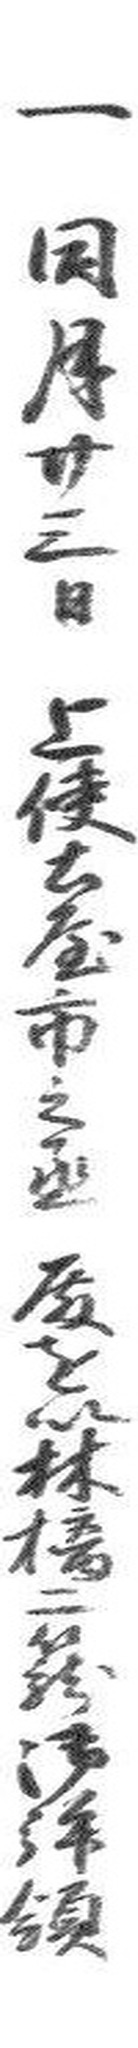一同月廿三日上使土屋市之丞殿を以林檎二籠御拝領
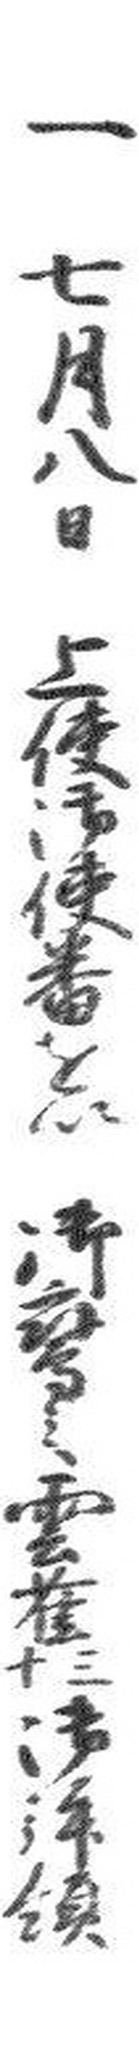一七月八日上使御使番を以御鷹之雲雀三十御拝領
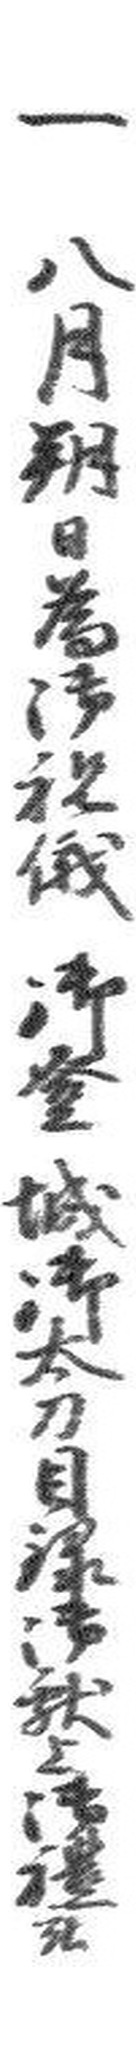一八月朔日為御祝儀御登城御太刀目録御献上御礼被
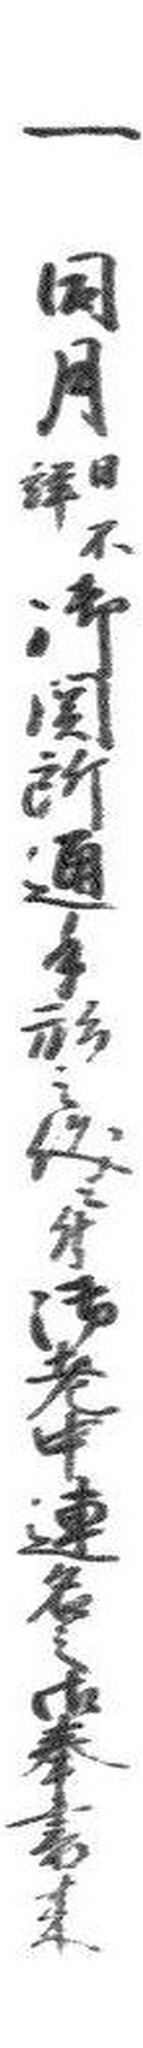一同月日不詳御関所通手形之儀ニ付御老中連名之御奉書来
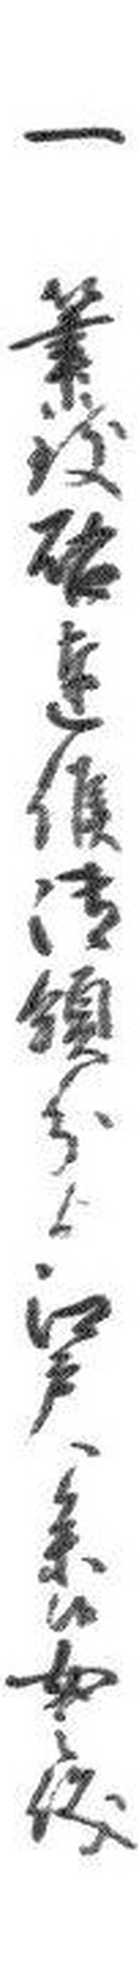一筆致啓達候御領分ゟ江戸へ参候女之儀
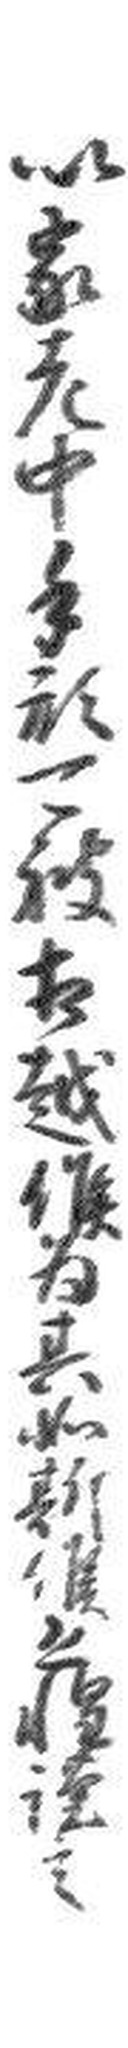以家老中手形可被相越候為其如斯候恐惶謹言
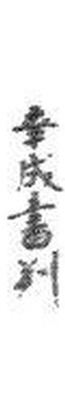幸成書判
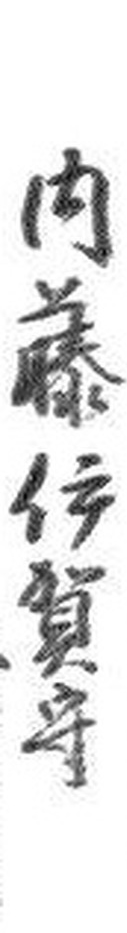内藤伊賀守
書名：家譜 四 忠昌公 従寛永七年到正保四年
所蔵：福井県文書館 Fukui Prefectural Archives
